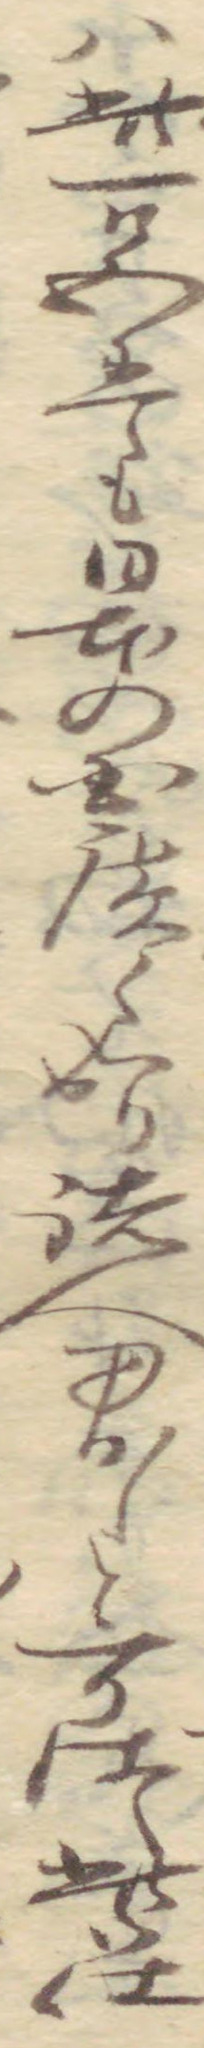は此一色にても日本の国広く成り諸人ゆる〳〵と可仕候此の御仕
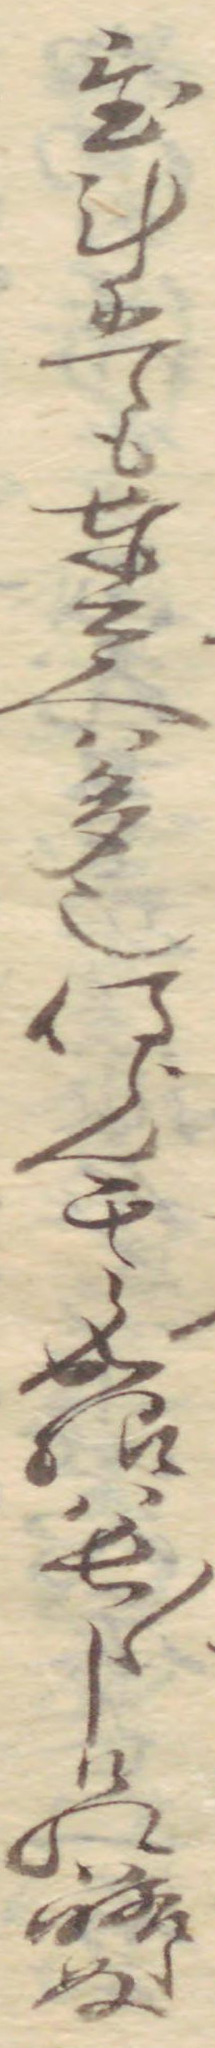置計にても奉公人は多也侍らん其被成様は長〳〵しけれは略しぬ
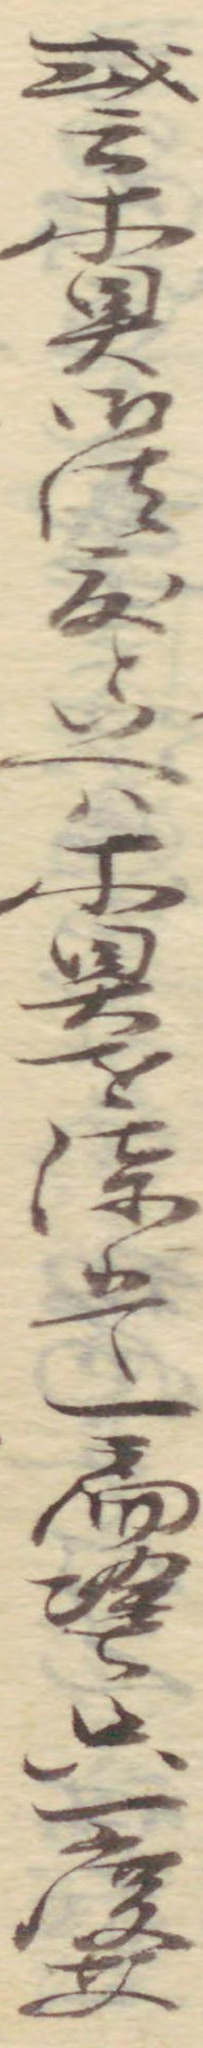或云木具御法度といへは木具を漆にて一扁塗只一度な
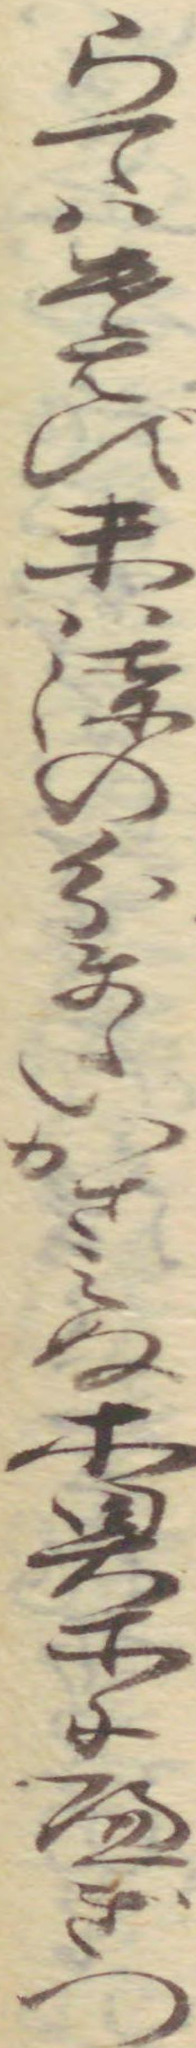らては遣はず末は漆の分またかさみぬ木具等にへぎつ
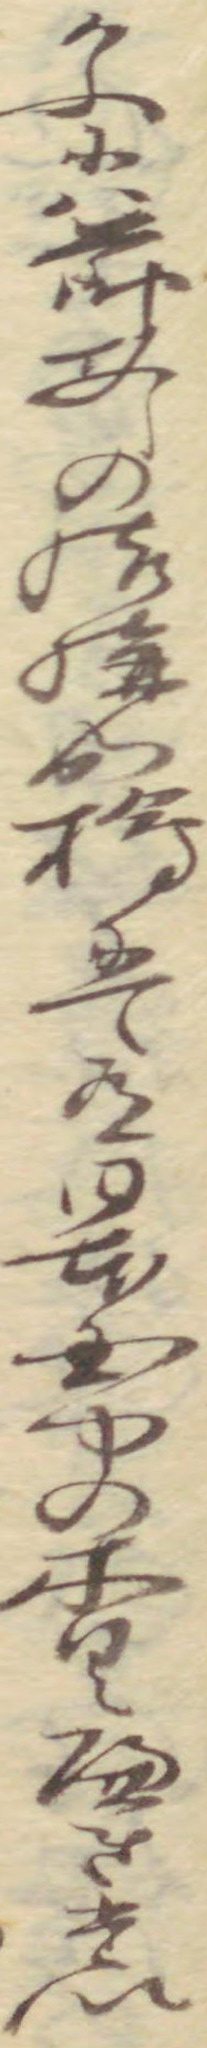かふには節なしの結構成桧にて有日本国中の木具へきたい
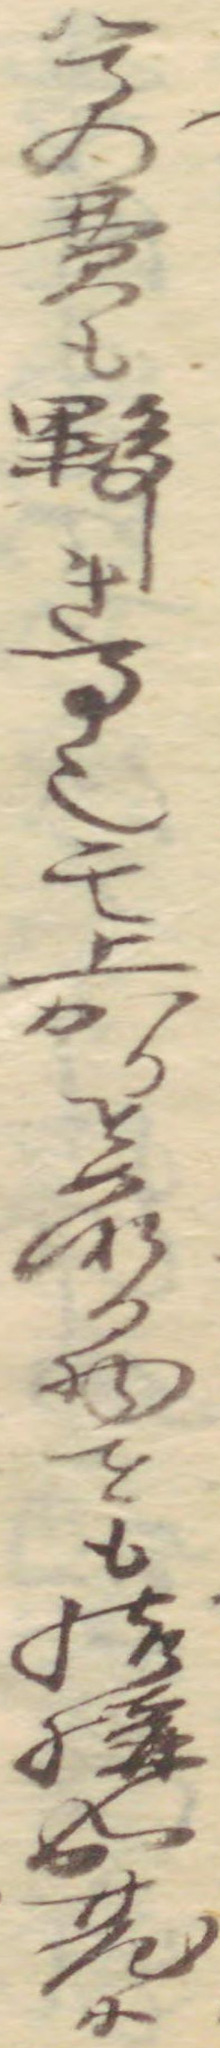等の費も夥しき事也其上かりそめなる物をも結構成台に
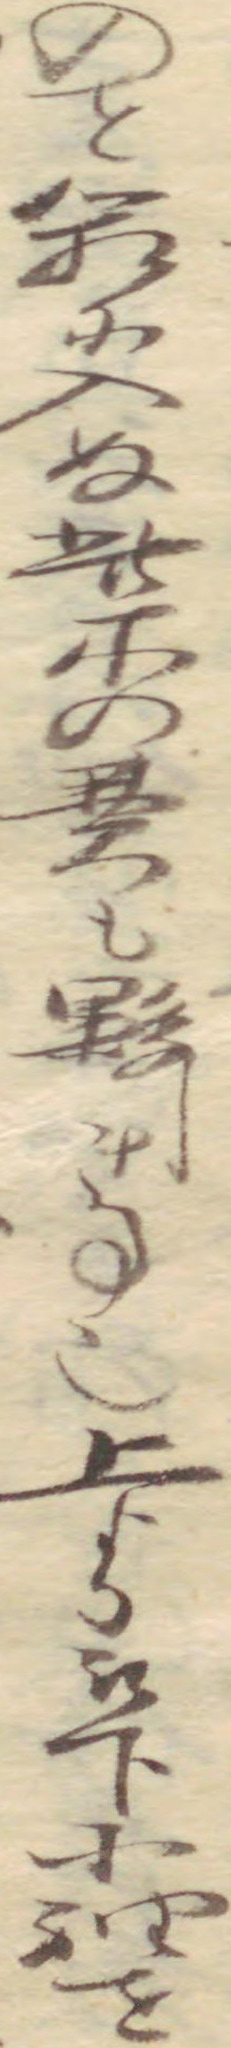のせ箱に入ぬ此等の費も夥しき事也上より被下小袖を
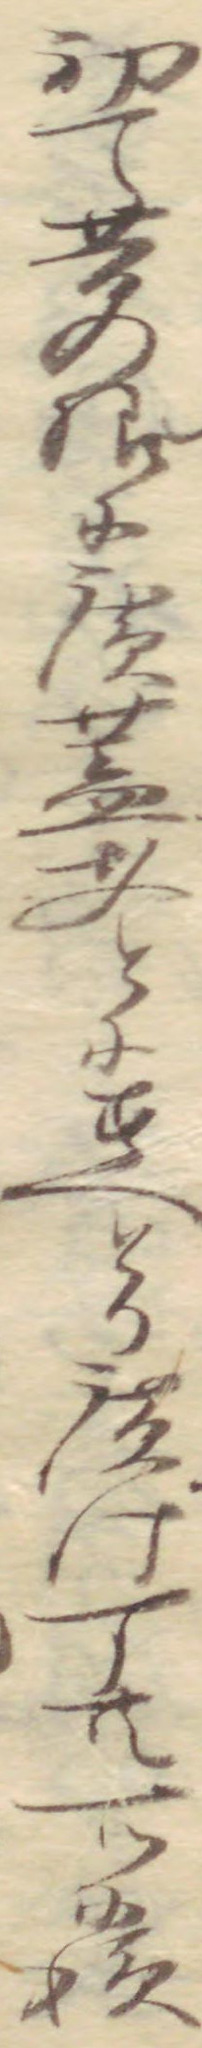初て昔の様に広蓋なとにすへとり広けす共一ツに積
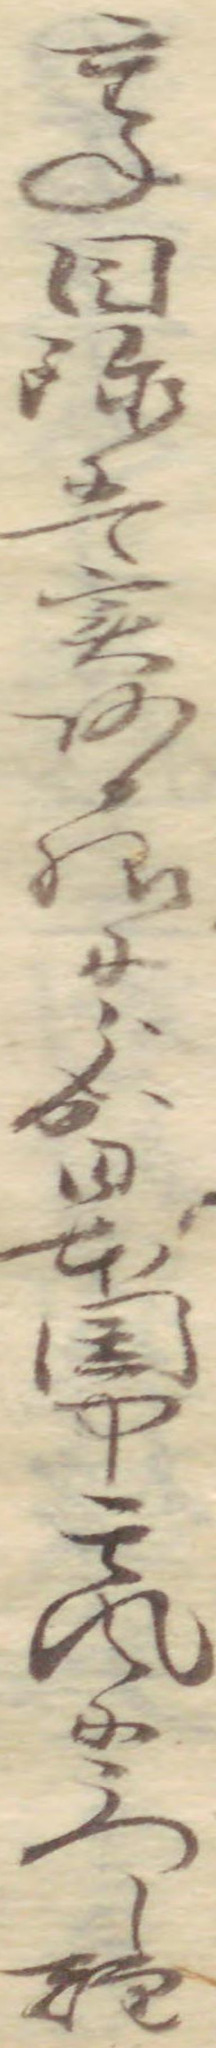重ね目録にて実ある様に被成日本国中其風にうつし軽
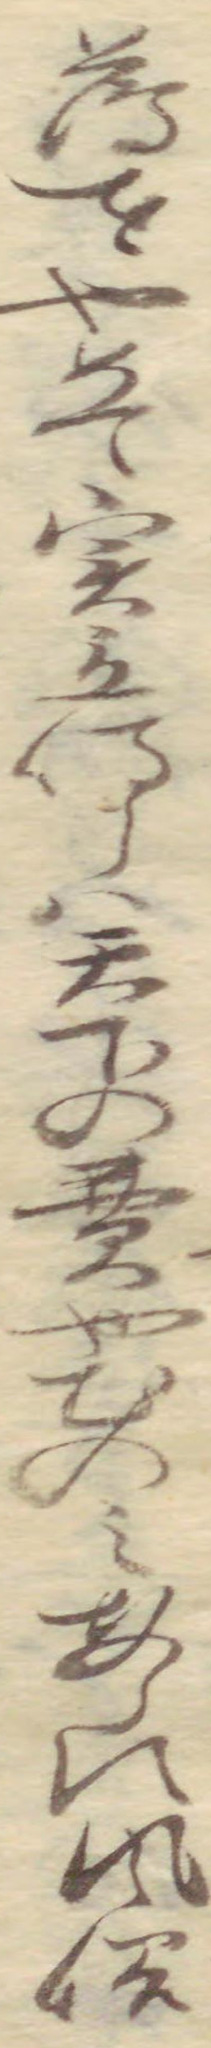薄をやめて実立侍らは天下の費やむのみならす風俗
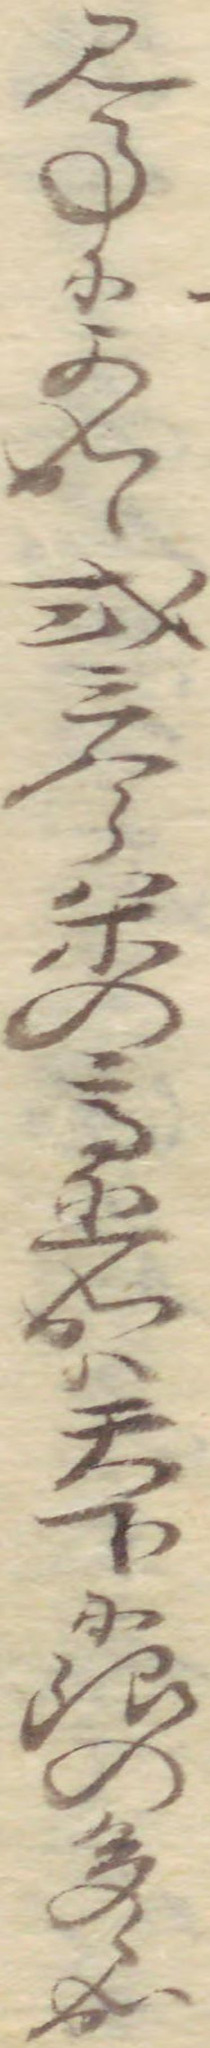見事に可成候或云今米の高直成は天下に銀の多く成
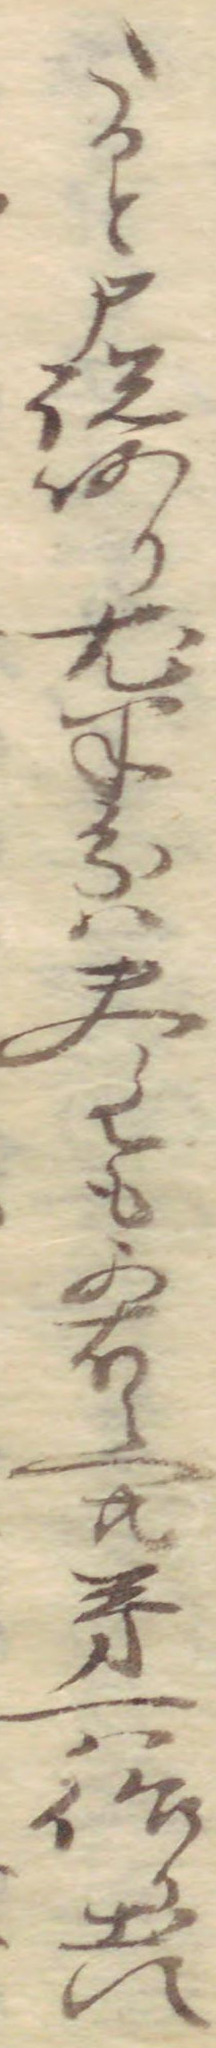たると申説あり尤半分は夫ニても可有候へ共第一は作り出す
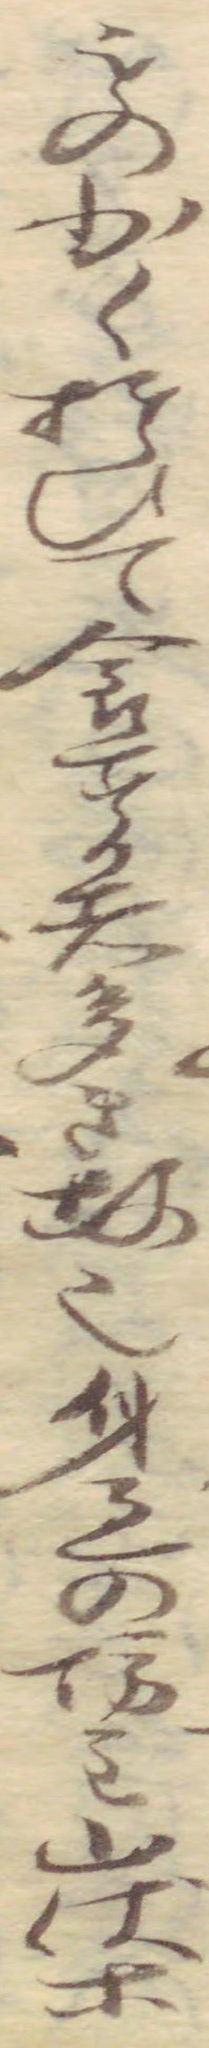もの少く遊ひて食する者多き故也身過の坊主山伏等
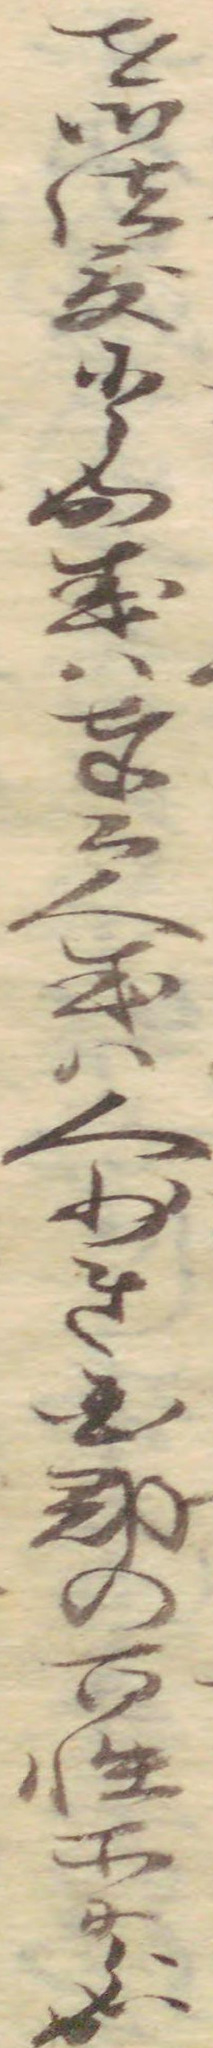を御法度に被成或は奉公人或は人少き国郡の百姓等に被成
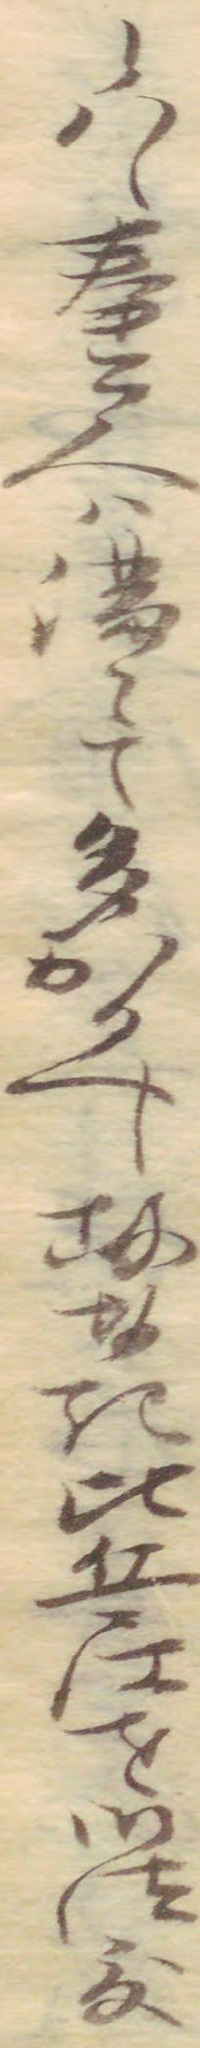候はゝ奉公人は満〻て多かるへし故なき比丘尼を御法度

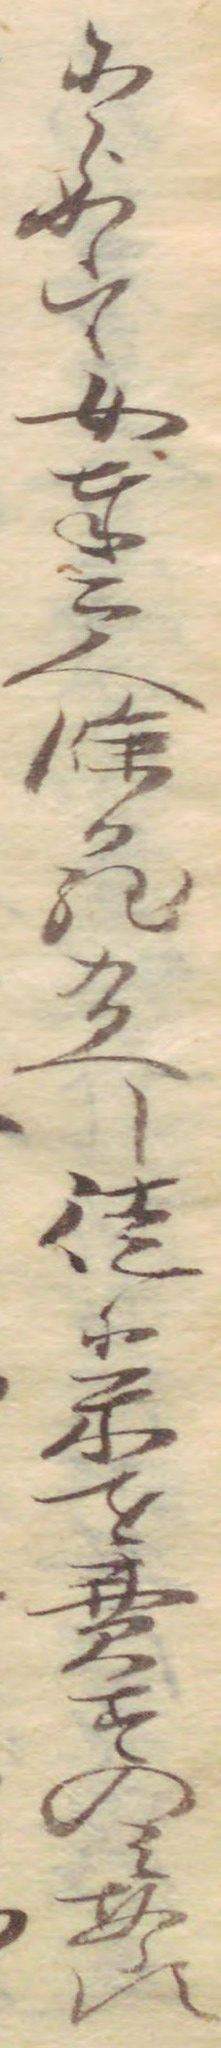に被成候はゝ女奉公人除る程有へし徒に米を費すのみならす
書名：鶯宿雑記. 巻263-264
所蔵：国立国会図書館 National Diet Library, JAPAN
